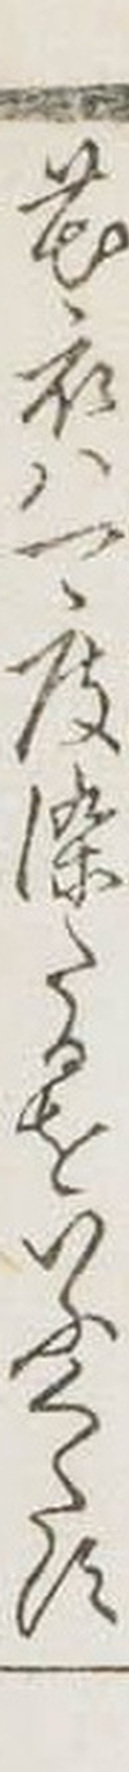花衣は一度染たるをいふくたす
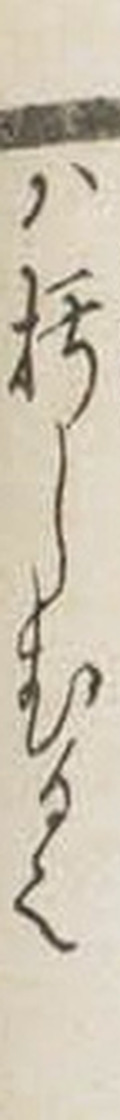は朽しむる也
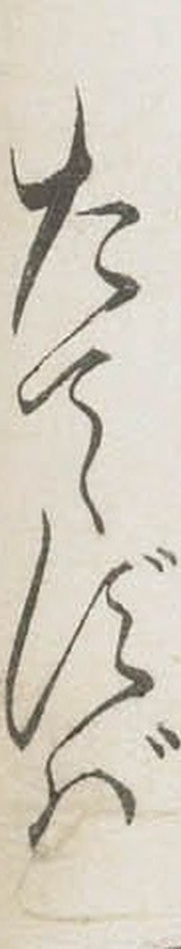たてずば
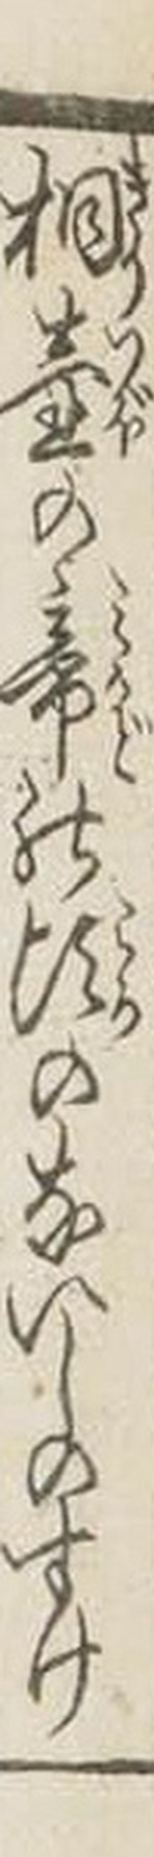桐壺の帝の頃のないしのすけ
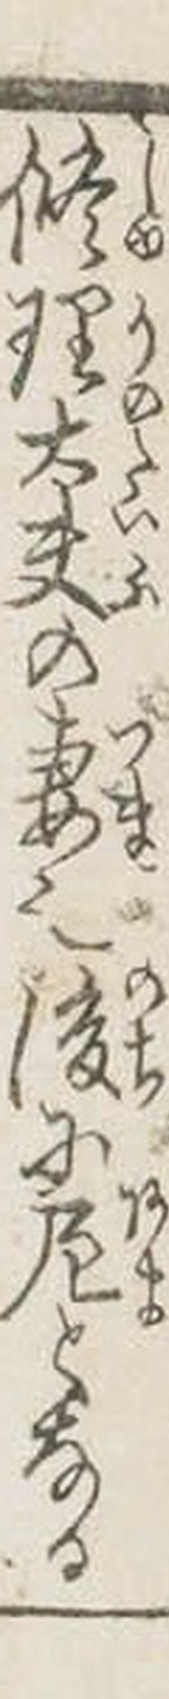修理大夫の妻也後に尼となる
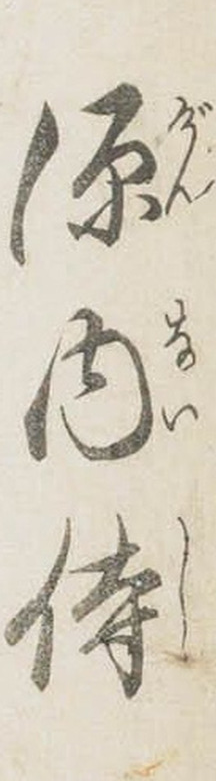源内侍
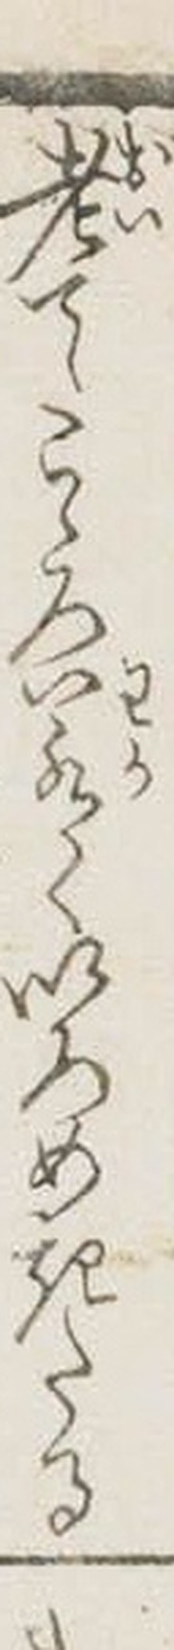老てこゝろ若くいろめきたる
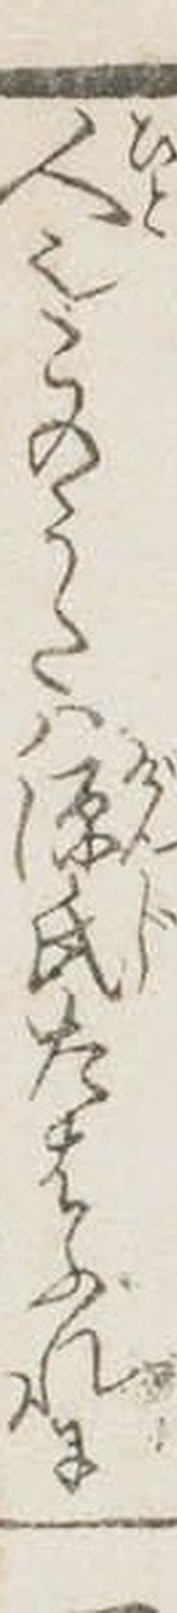人也このうたは源氏たはふれに
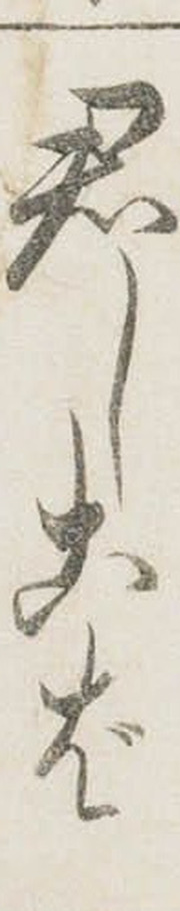君しこば
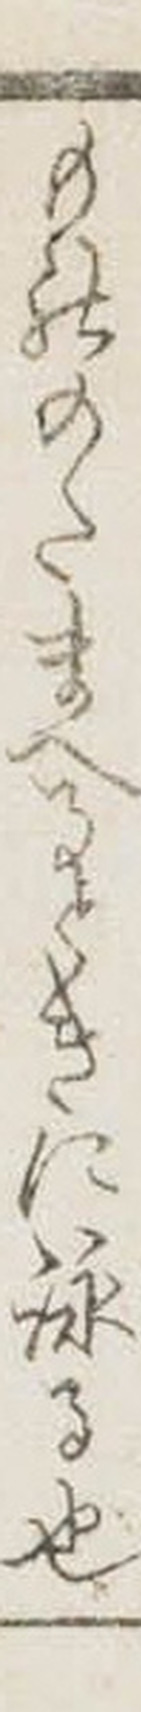もののたまへるときに詠る也
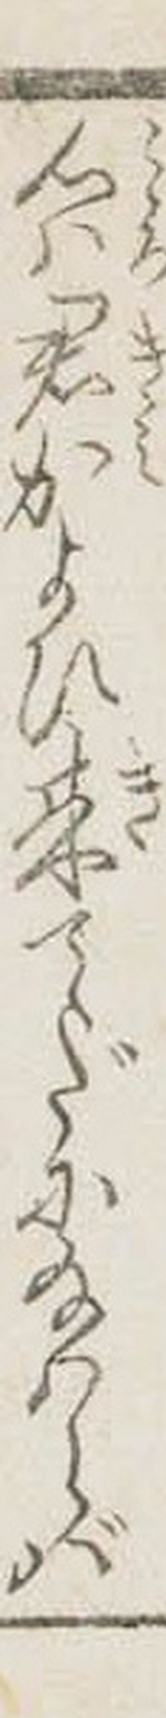心は君かよひ来てだに給はらば
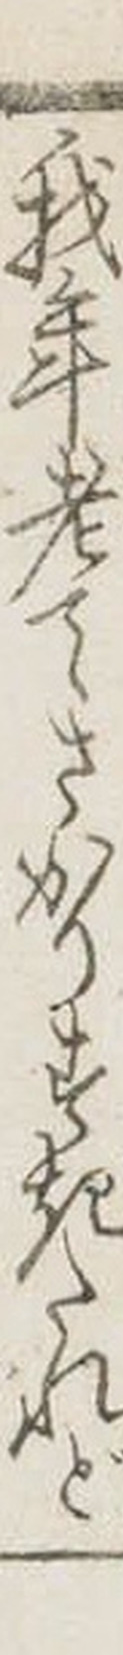我年老てさかりすぎたれど
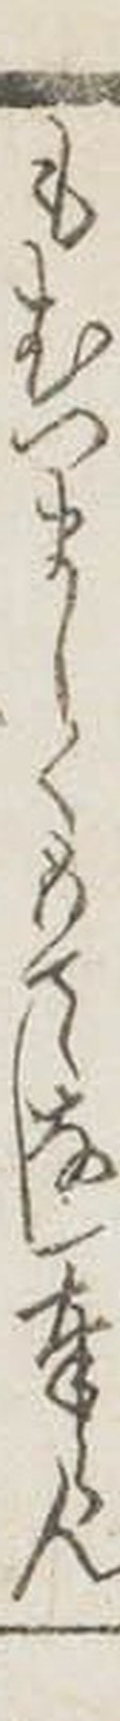もむつましくもてなし奉らん
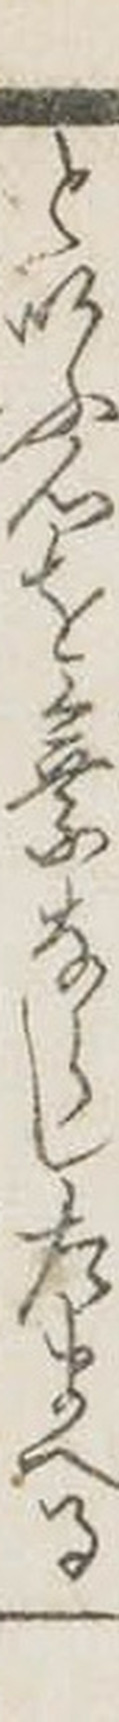といふ心を乗ならしたまへる
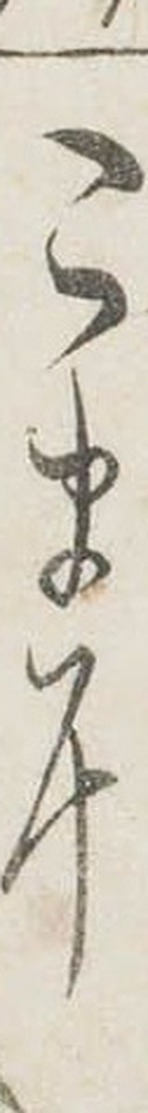こまに
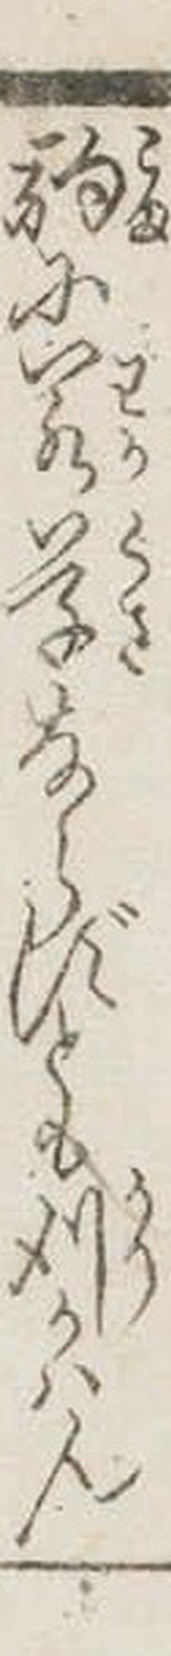駒に若草ならずとも刈かはん
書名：源氏百人一首
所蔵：東京学芸大学教育コンテンツアーカイブ
